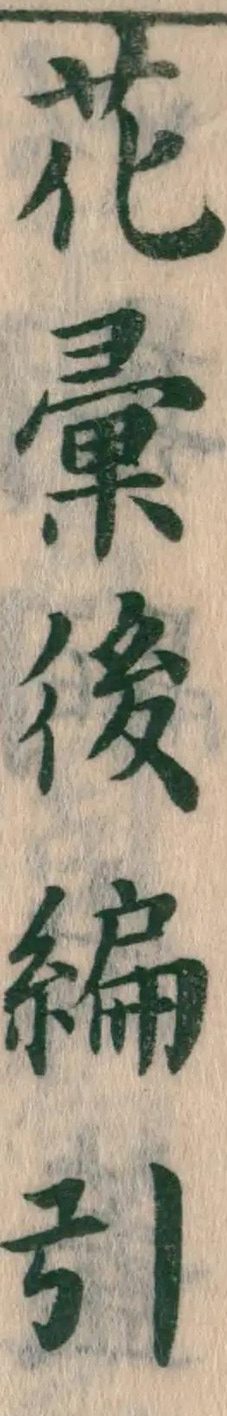花彙後編引
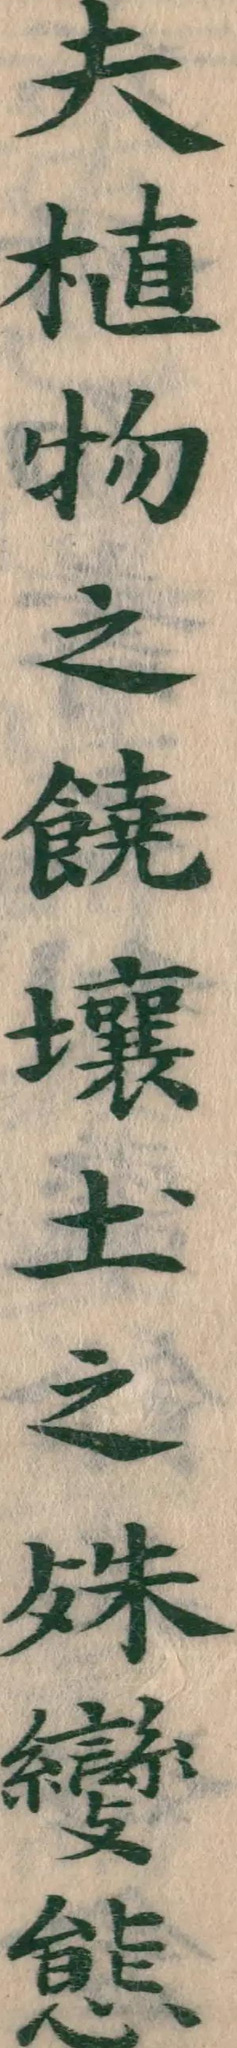夫植物之饒壌土之殊変態
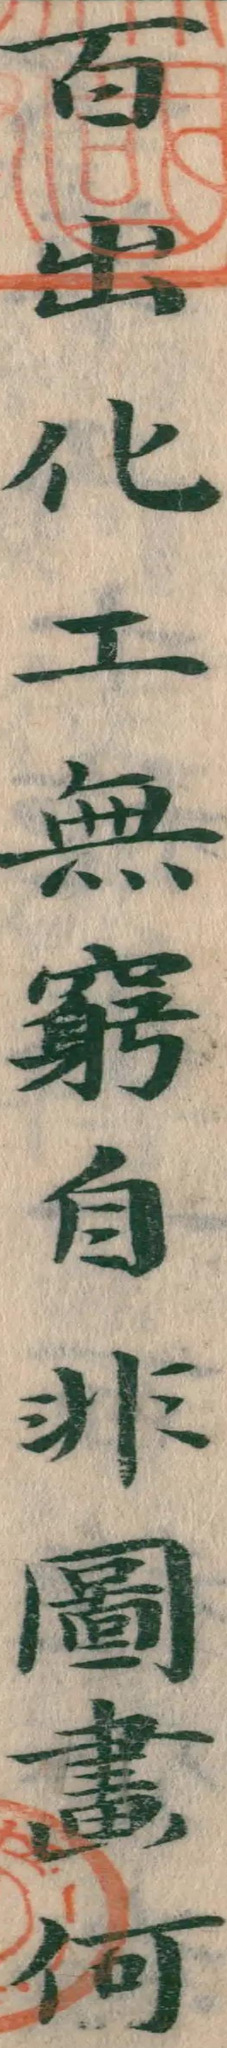百出化工無窮自非図画何
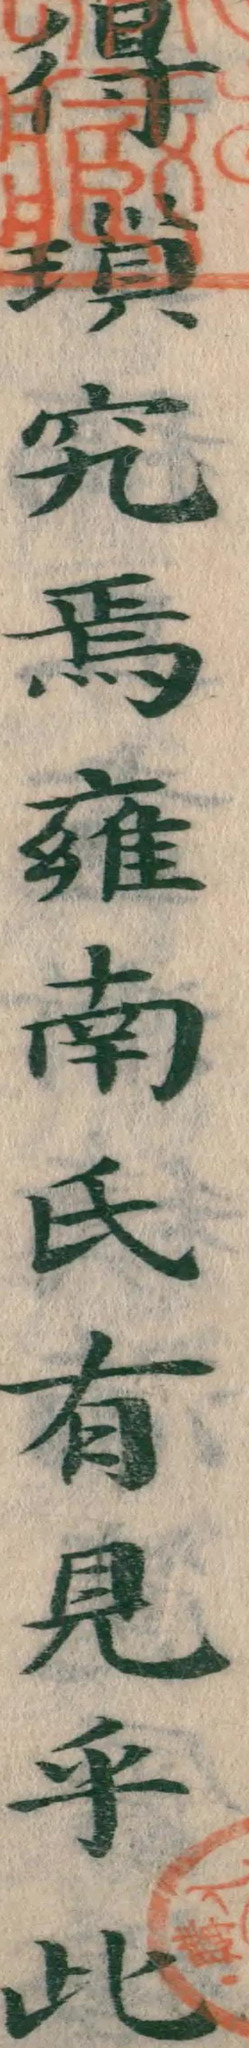得瑣究焉雍南氏有見乎此
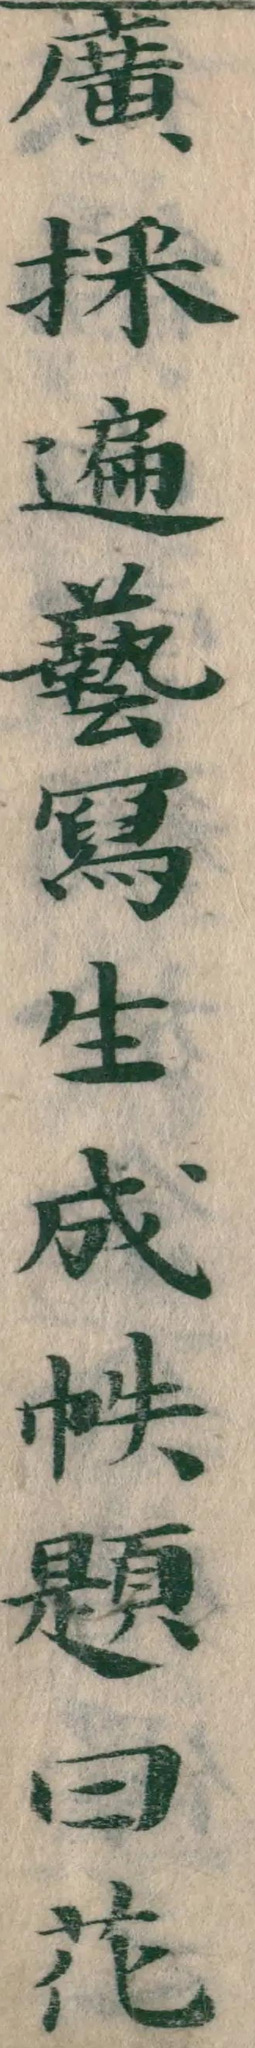広採遍芸写生成帙題曰花
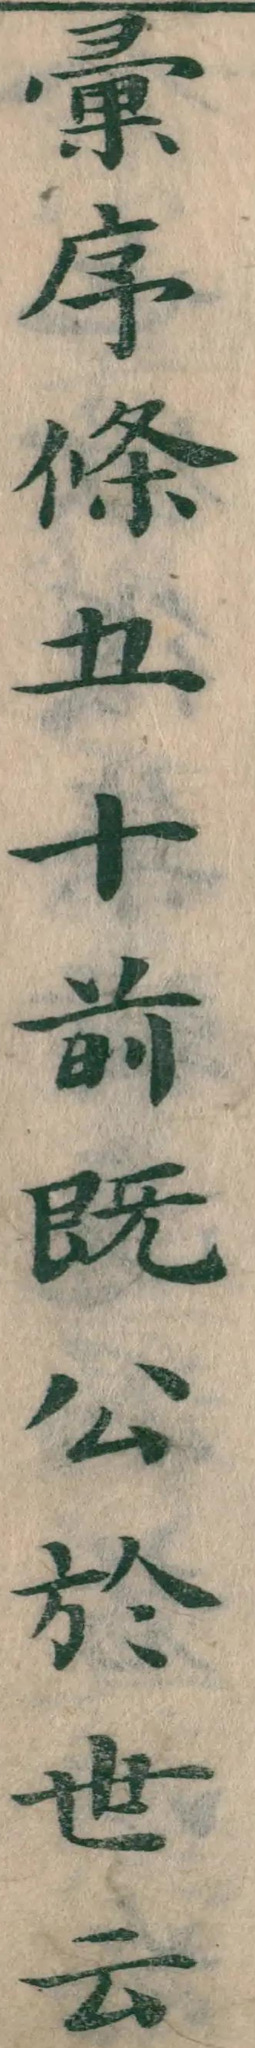彙序条五十前既公於世云

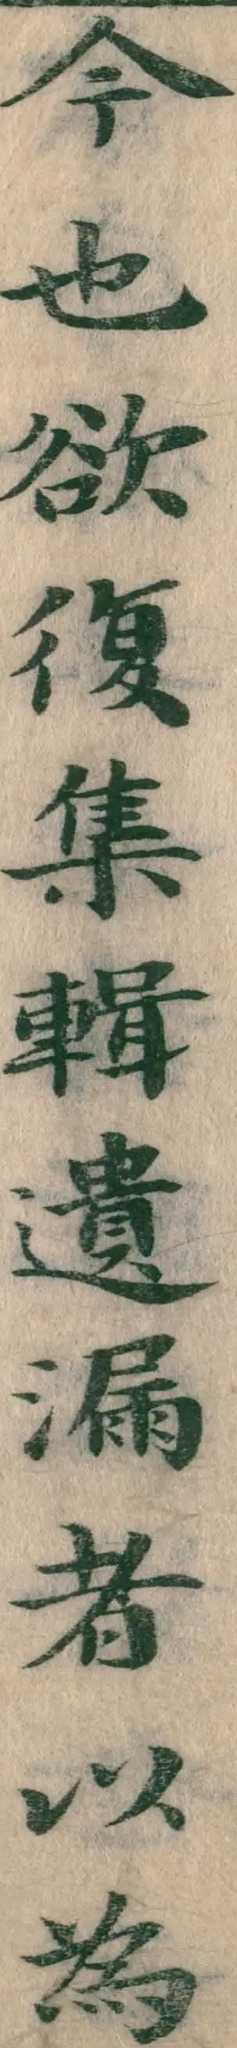今也欲復集輯遺漏者以為
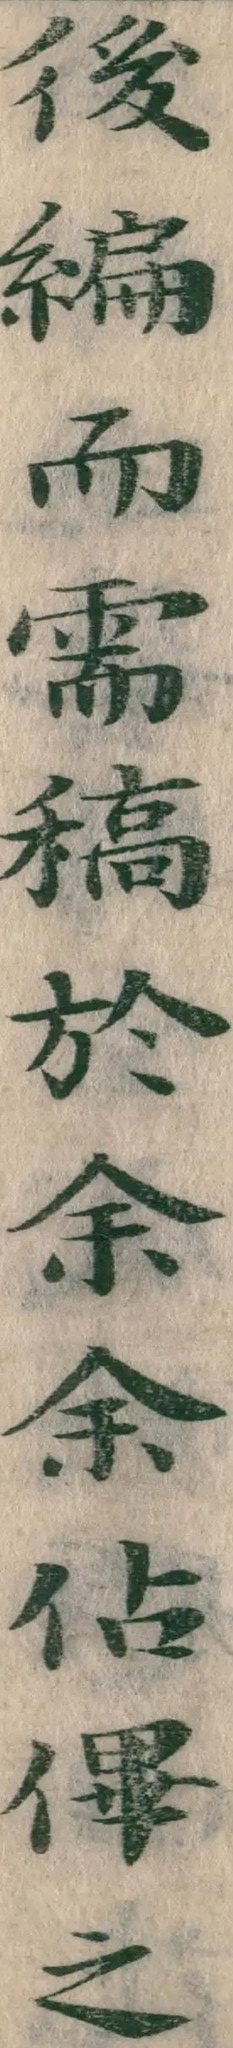後編而需稿於余余佔𠌫之
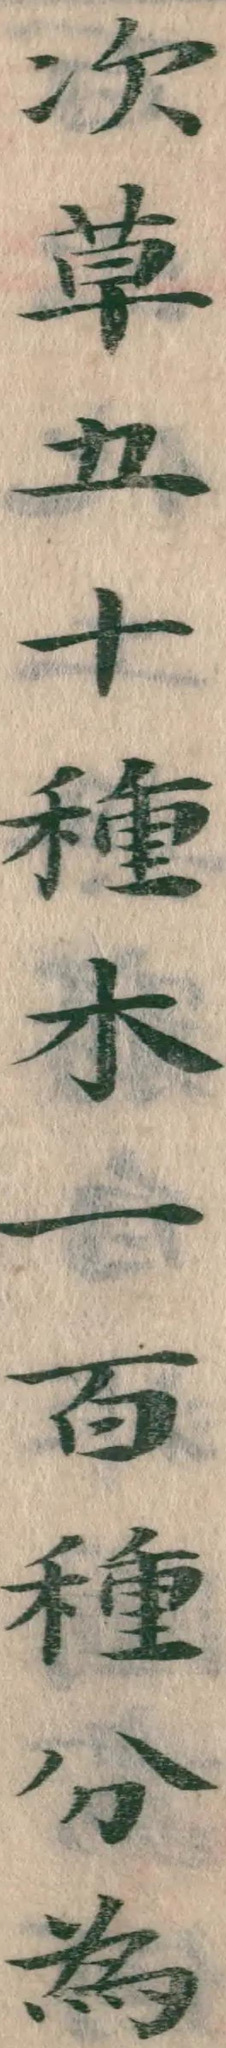次草五十種木一百種分為
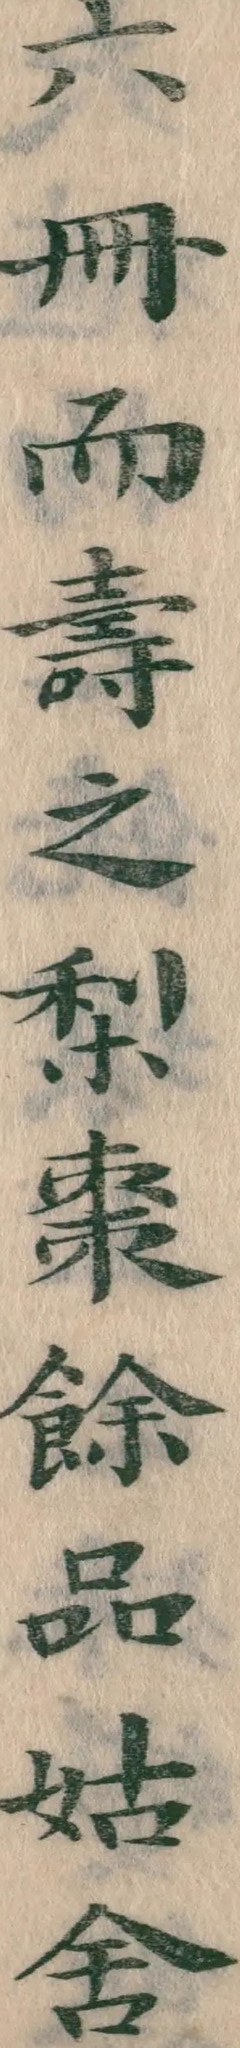六冊而寿之梨棗余品姑舎
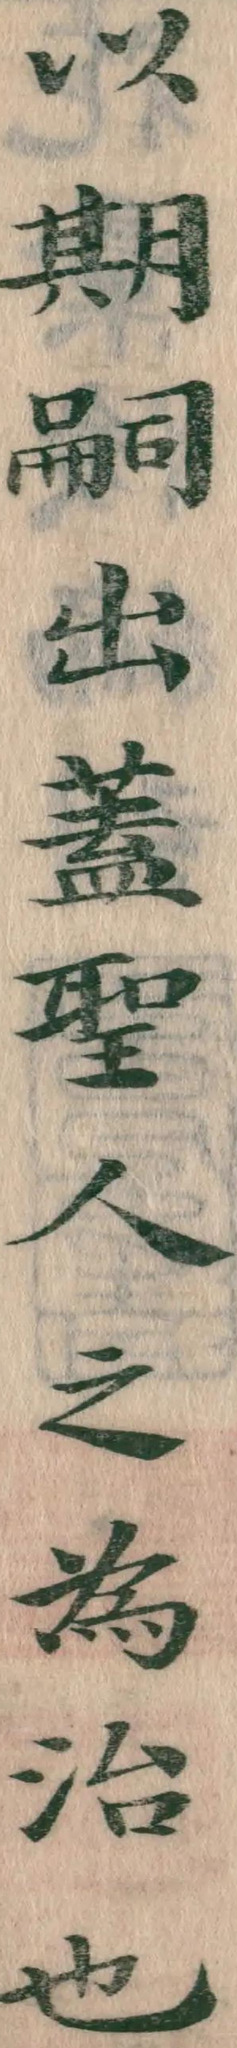以期嗣出蓋聖人之為治也
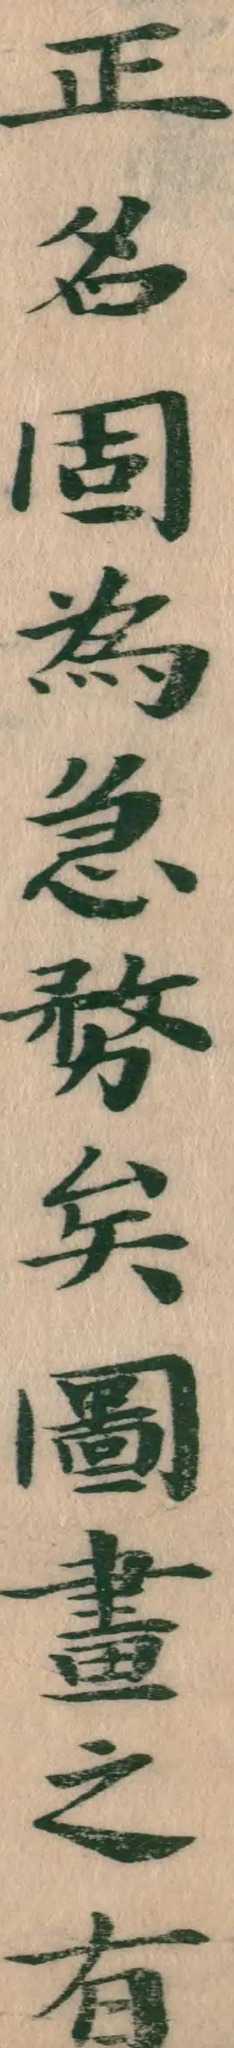正名固為急務矣図画之有
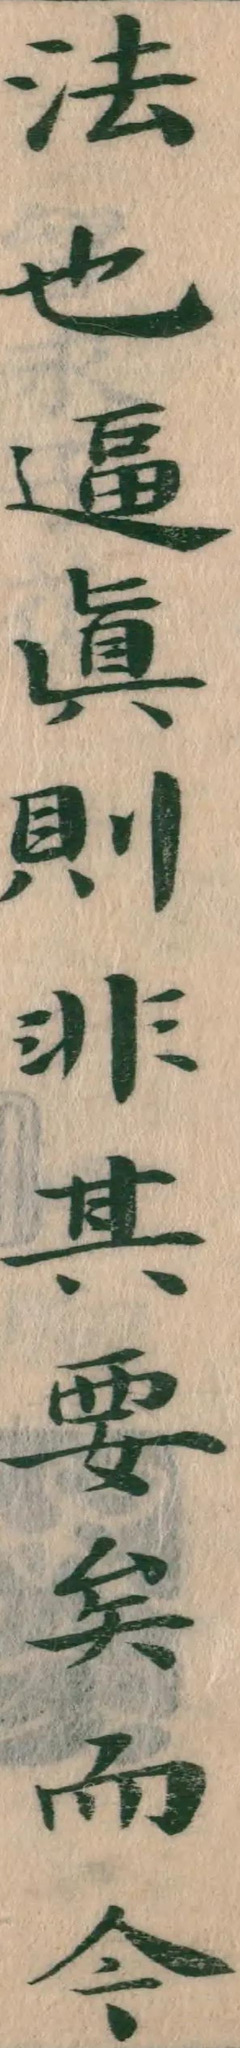法也逼真則非其要矣而今
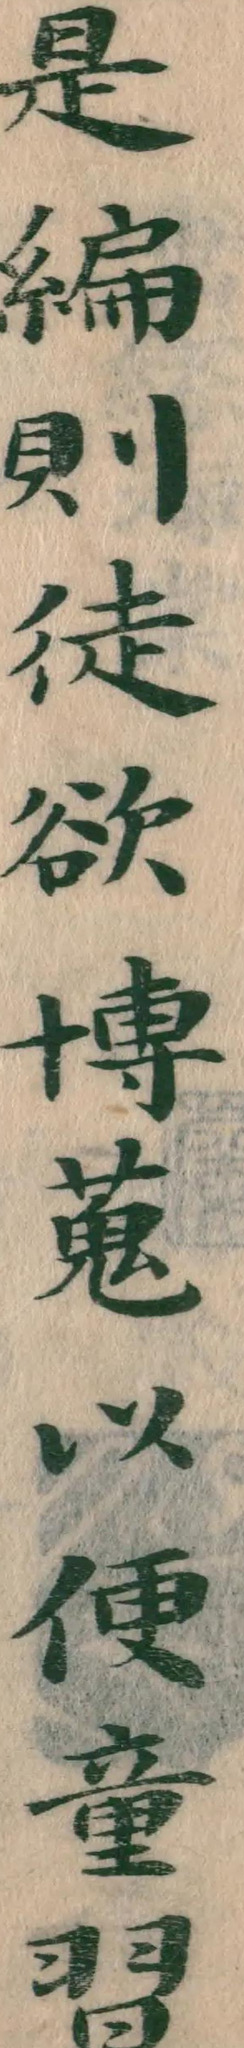是編則徒欲博蒐以便童習
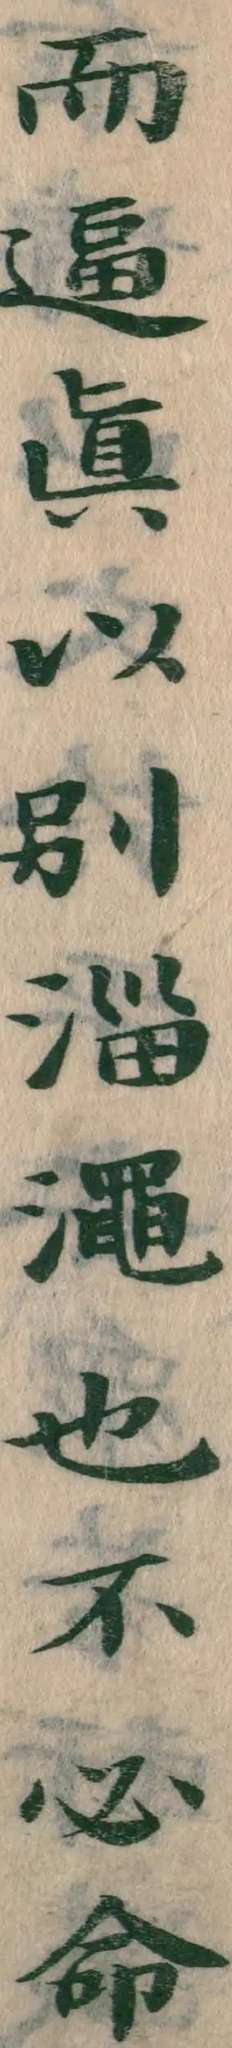而逼真以別淄澠也不必命
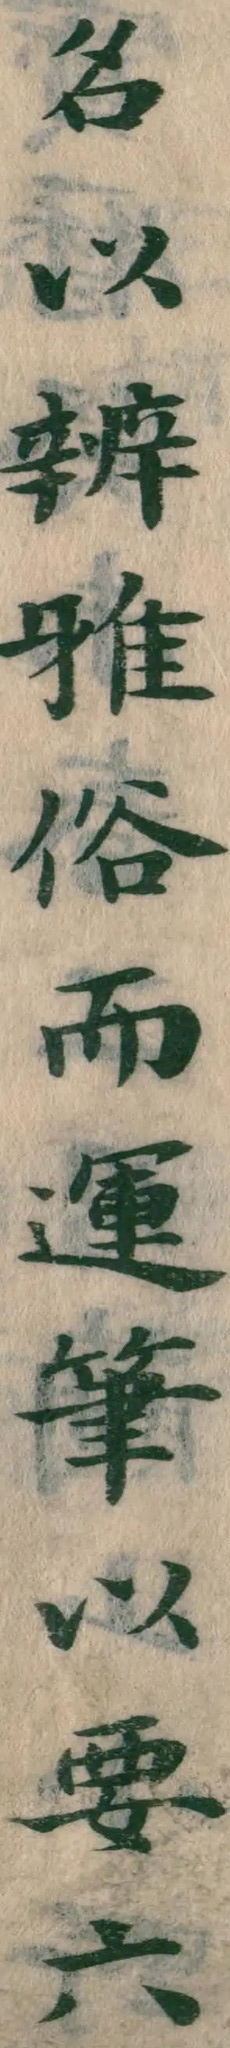名以弁雅俗而運筆以要六
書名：花彙 草部4巻木部4巻. [2]
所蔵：国立国会図書館 National Diet Library, JAPAN
